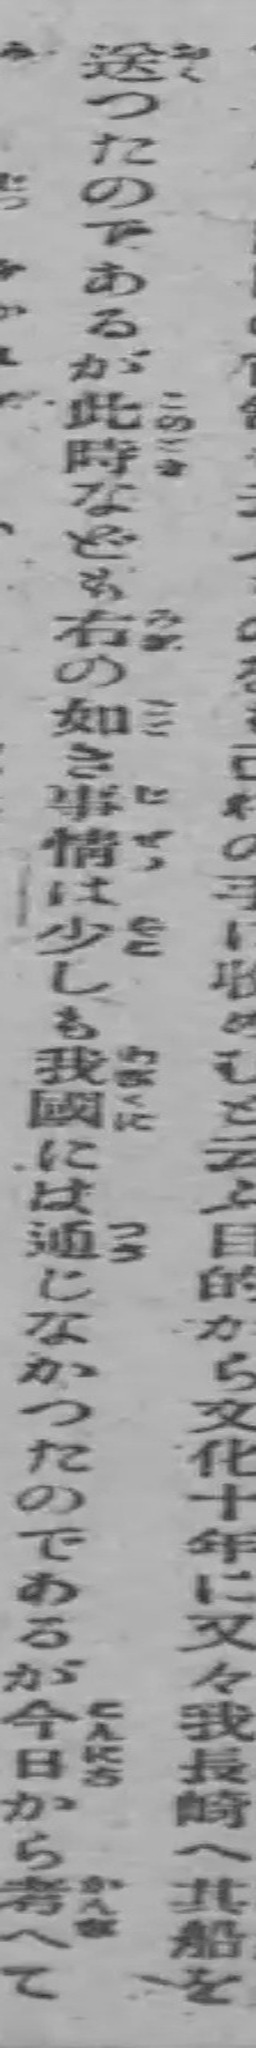送つたのであるが此時なども右の如き事情は少しも我国には通じなかつたのであるが今日から考へて
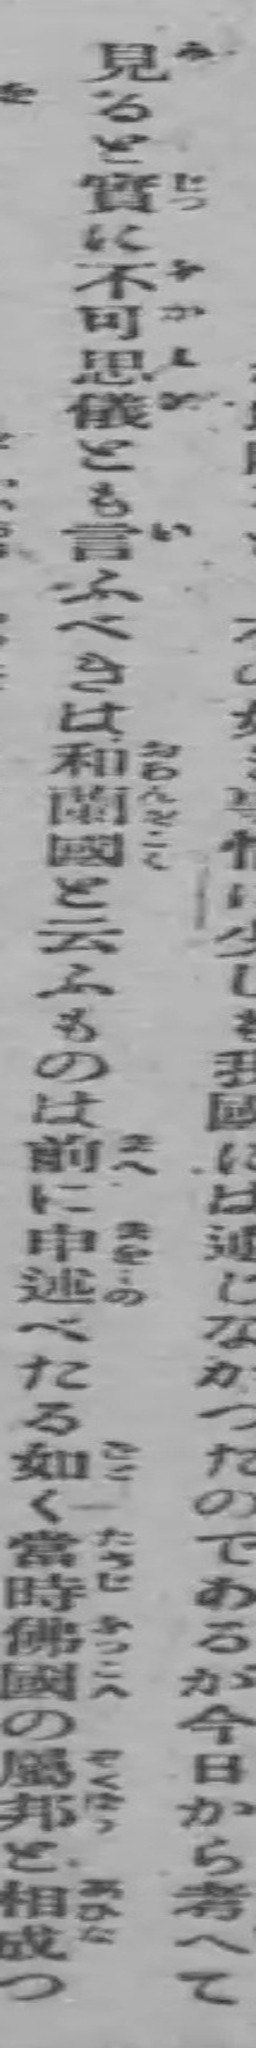見ると実に不可思儀とも言ふべきは和蘭国と云ふものは前に申述べたる如く当時仏国の属邦と相成つ
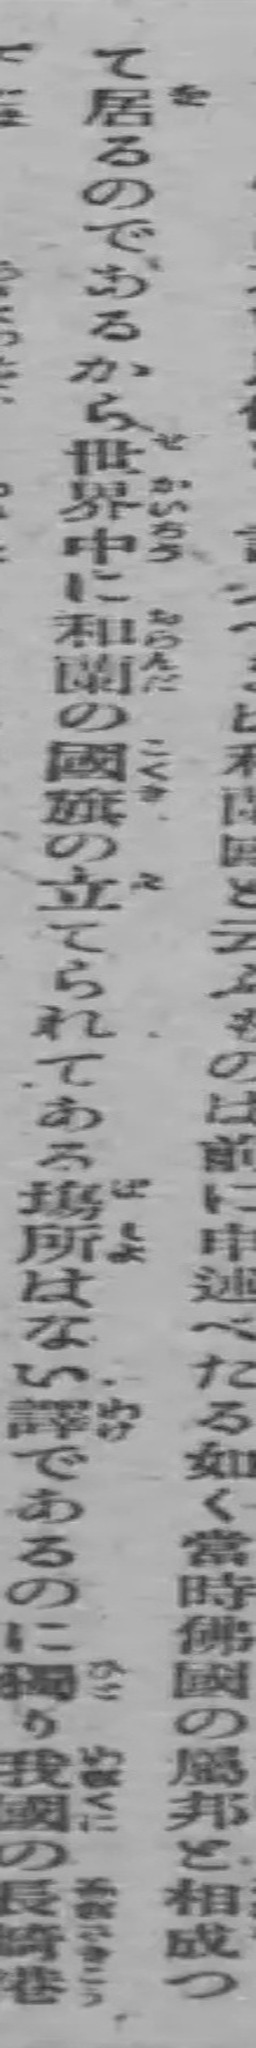て居るのであるから世界中に和蘭の国旗の立てられてある場所はない訳であるのに独り我国の長崎港
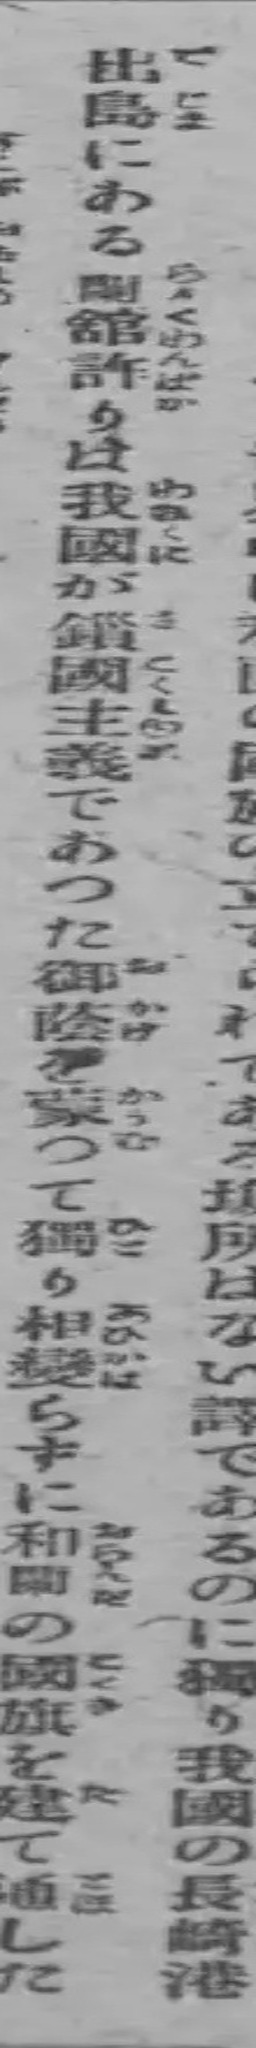出島にある蘭館許りは我国が鎖国主義であつた御蔭を蒙つて独り相変らずに和蘭の国旗を建て通した
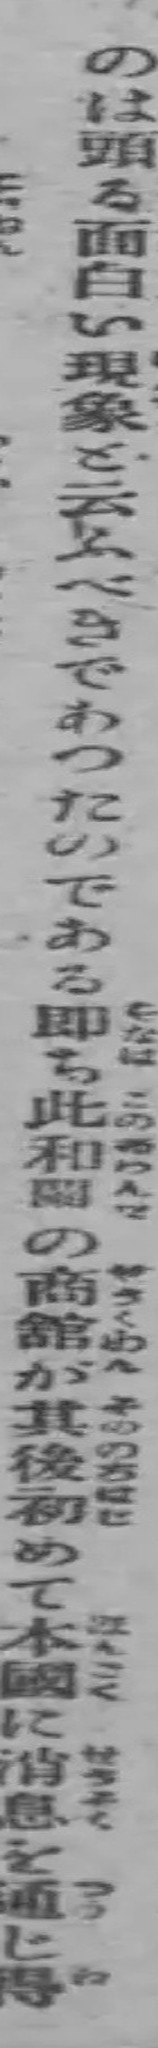のは頭る面白い現象と云ふべきであつたのである即ち此和蘭の商館が其後初めて本国に消息を通じ得
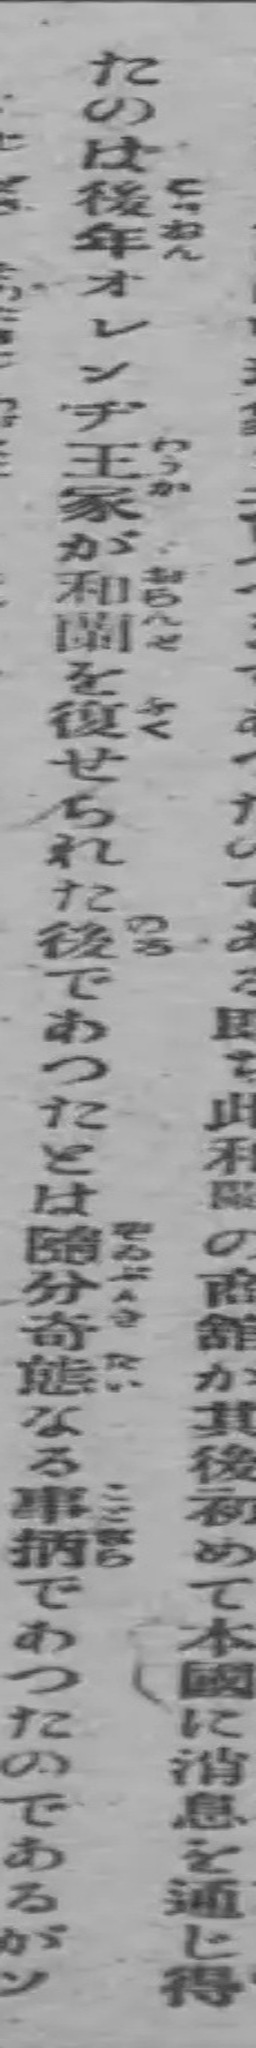たのは後年オレンヂ王家が和蘭を復せられた後であつたとは随分奇態なる事柄であつたのであるがソ
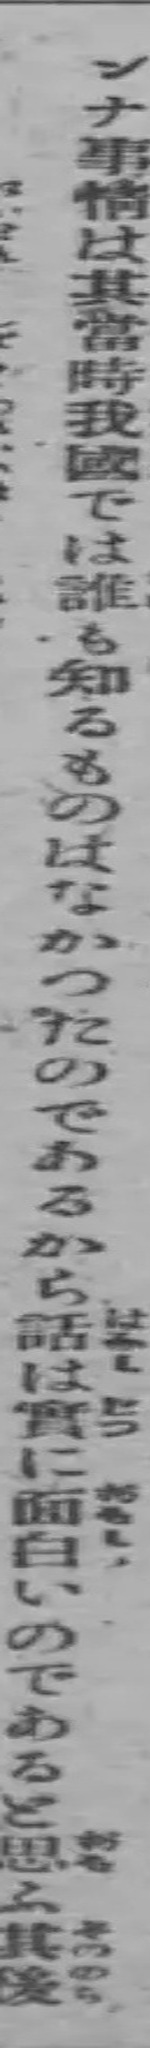ンナ事情は其当時我国では誰も知るものはなかつたのであるから話は実に面白いのであると思ふ其後
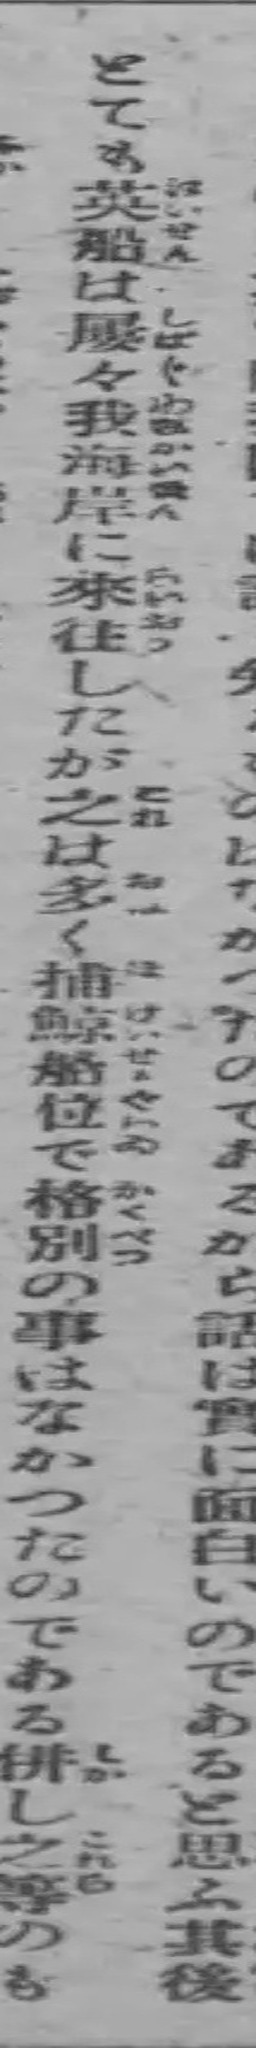とても英船は屡々我海岸に来往したが之は多く捕鯨船位で格別の事はなかつたのである併し之等のも
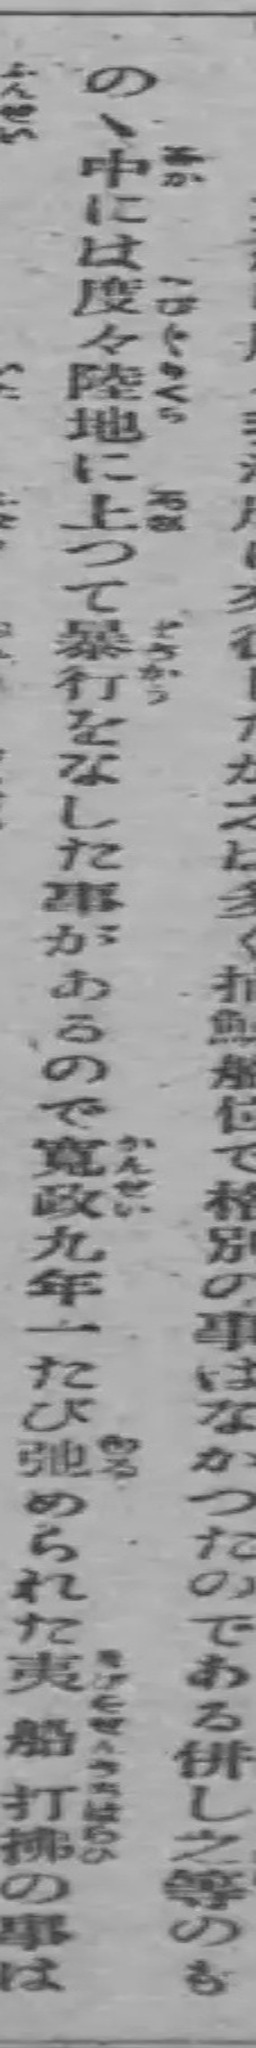のゝ中には度々陸地に上つて暴行をなした事があるので寛政九年一たび弛められた夷船打払の事は
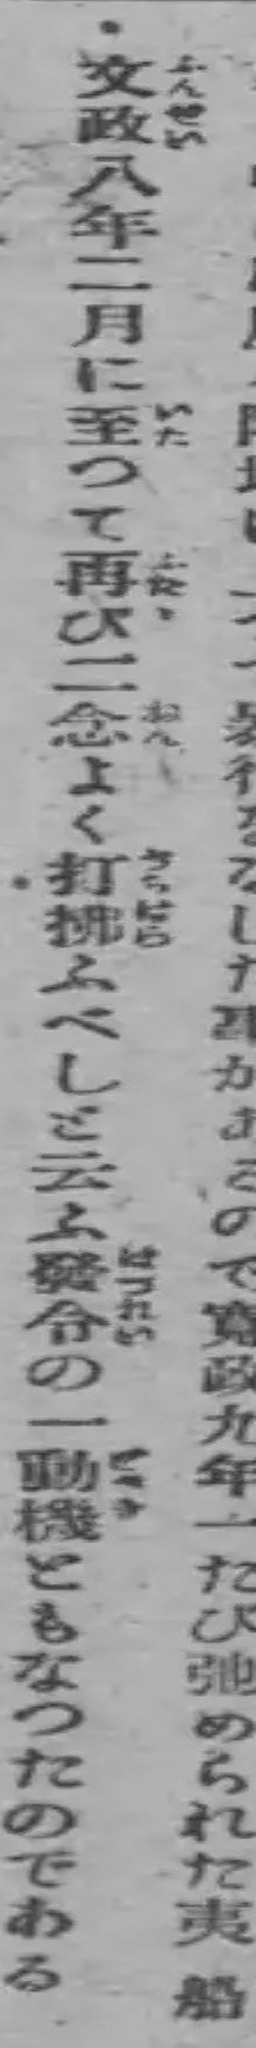文政八年二月に至つて再び二念よく打払ふべしと云ふ発令の一動機ともなつたのである
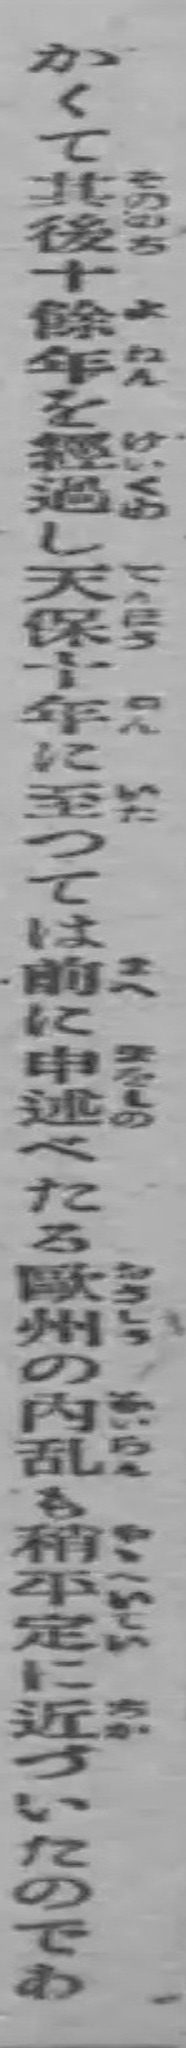かくて其後十余年を経過し天保十年に至つては前に申述べたる欧州の内乱も稍平定に近づいたのであ
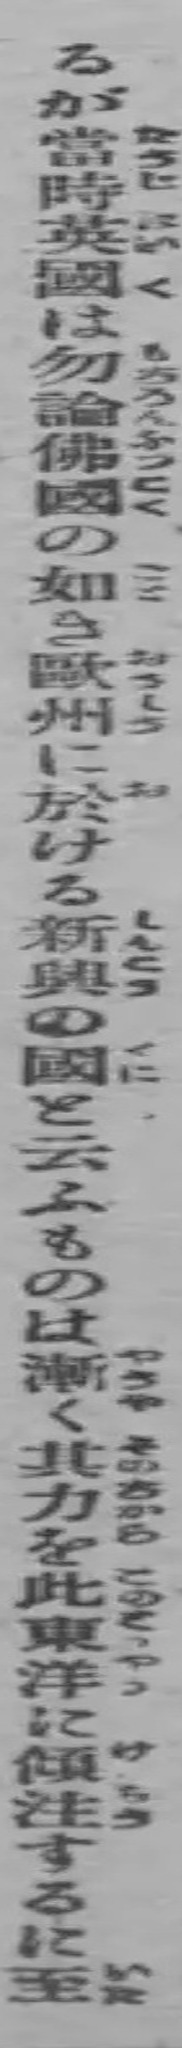るが当時英国は勿論仏国の如き欧州に於ける新興の国と云ふものは漸く其力を此東洋に傾注するに至
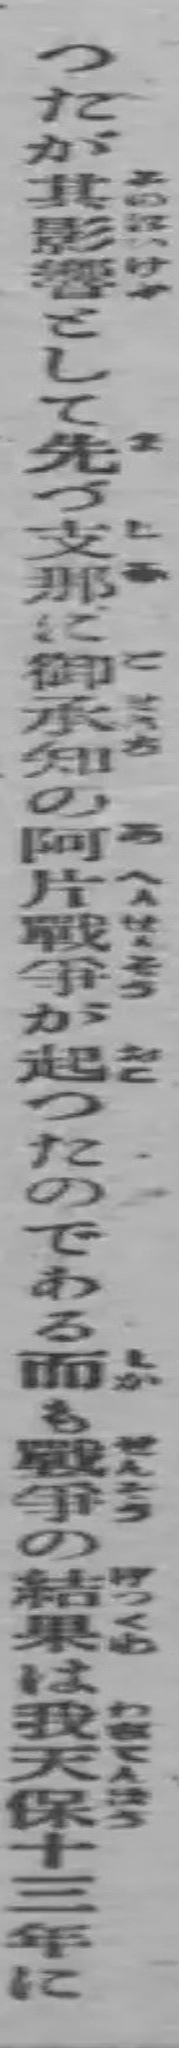つたが其影響として先づ支那に御承知の阿片戦争が起つたのである而も戦争の結果は我天保十三年に
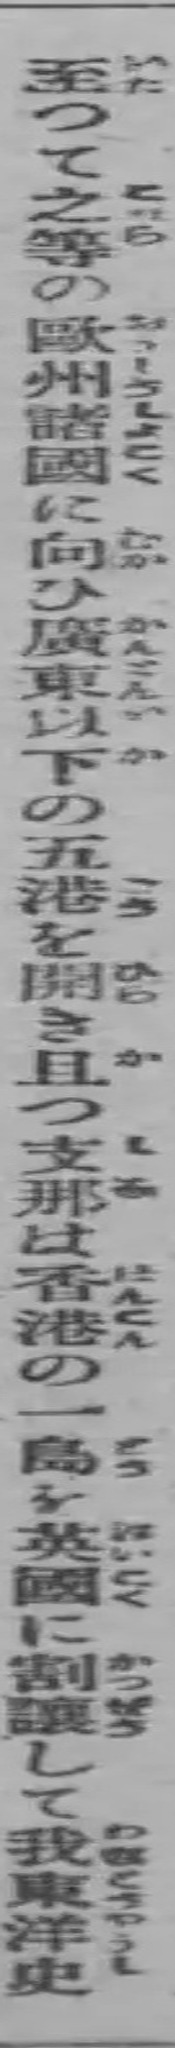至つて之等の欧州諸国に向ひ広東以下の五港を開き且つ支那は香港の一島を英国に割譲して我東洋史
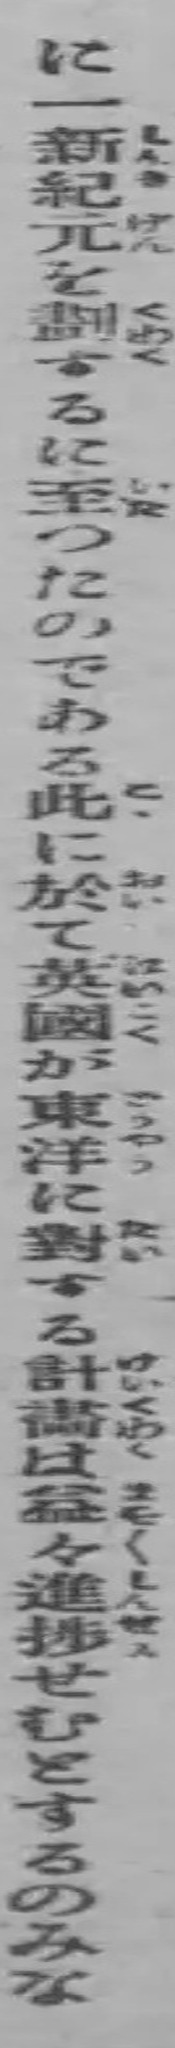に一新紀元を劃するに至つたのである此に於て英国が東洋に対する計画は益々進捗せむとするのみな
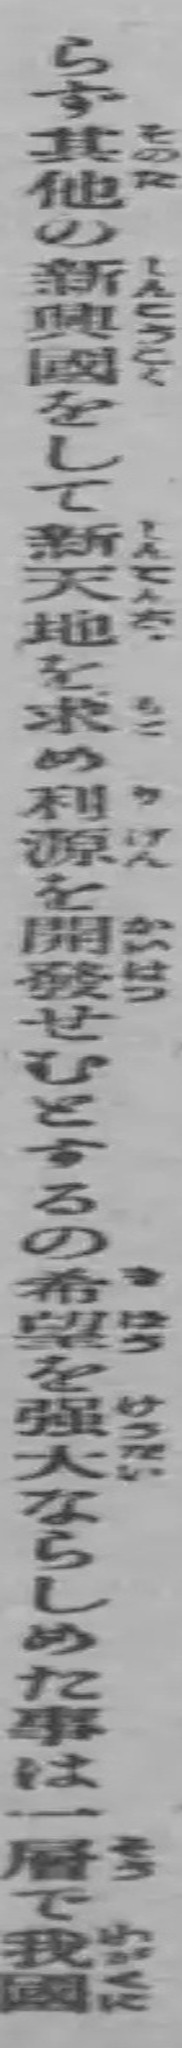らず其他の新興国をして新天地を求め利源を開発せむとするの希望を強大ならしめた事は一層で我国
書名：豊橋市史談
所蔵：国立国会図書館 National Diet Library, JAPAN
